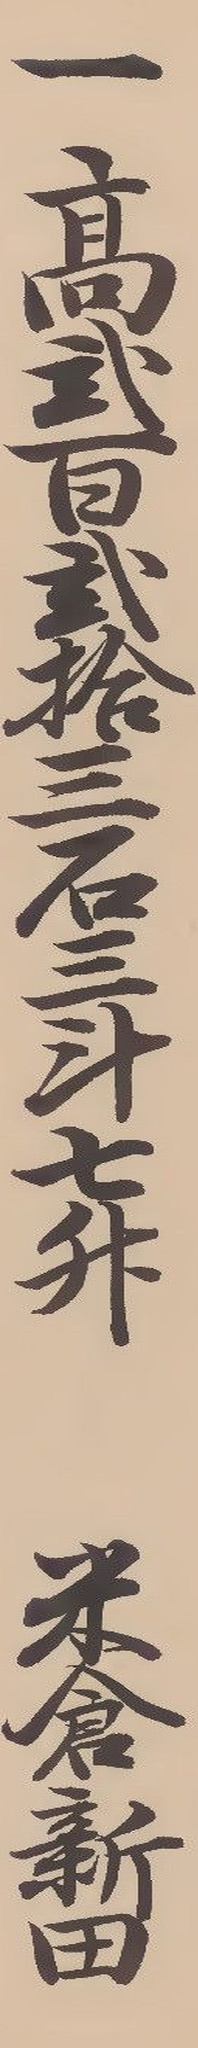一高弐百弐拾三石三斗七升米倉新田
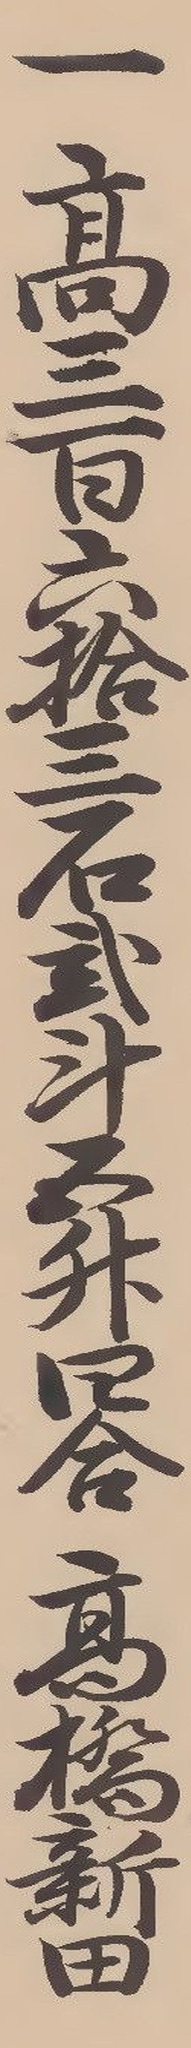一高三百六拾三石弐斗五升四合高橋新田
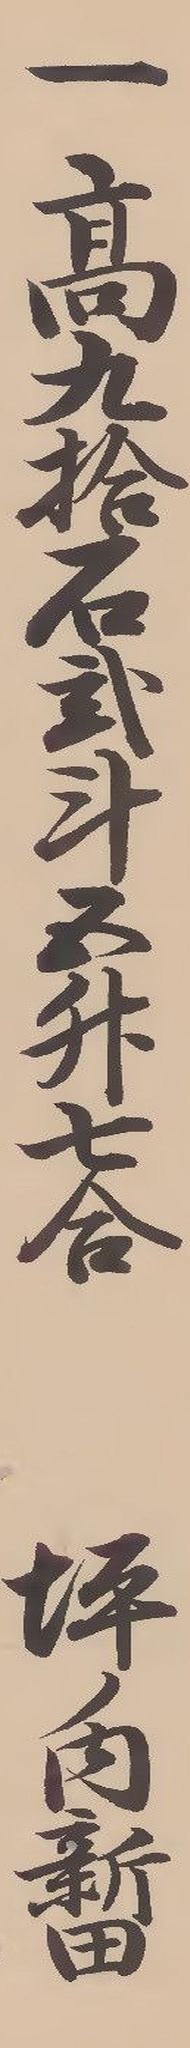一高九拾石弐斗五升七合坪ノ内新田
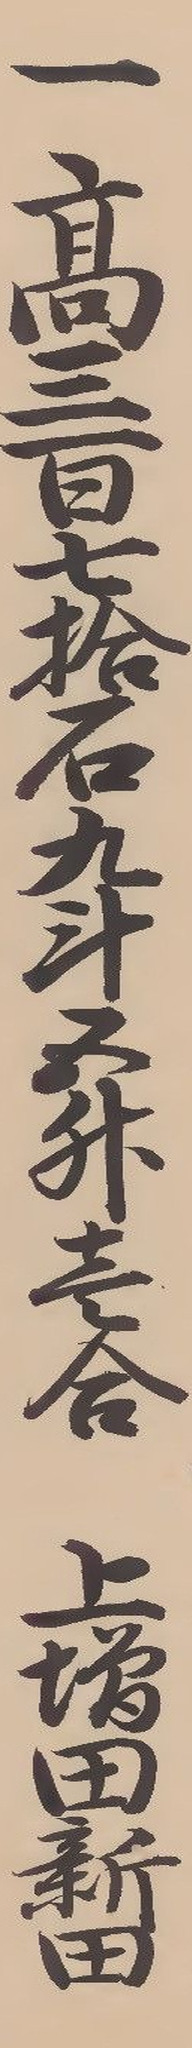一高三百七拾石九斗五升壱合上増田新田
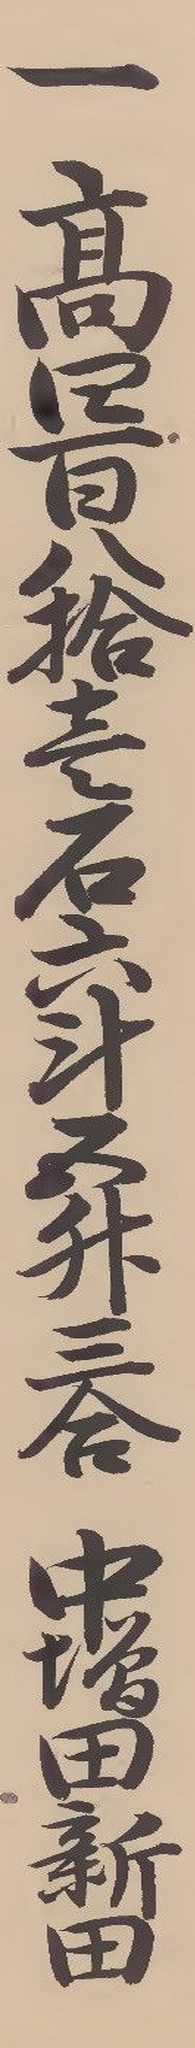一高四百八拾壱石六斗五升三合中増田新田
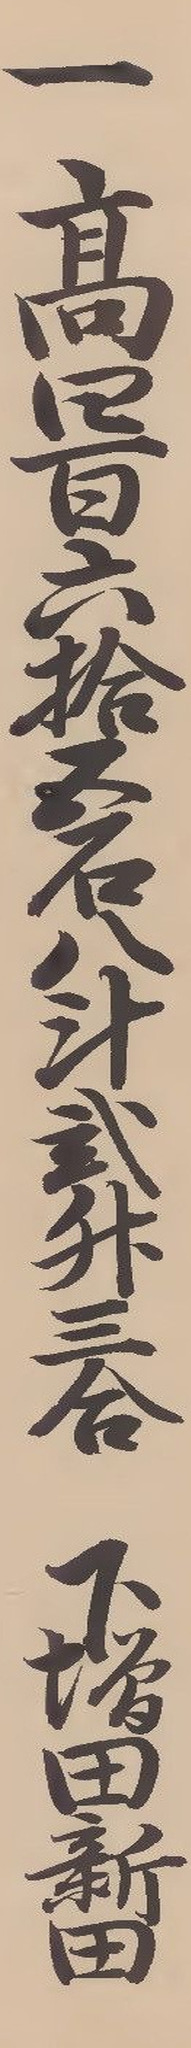一高四百六拾五石八斗弐升三合下増田新田
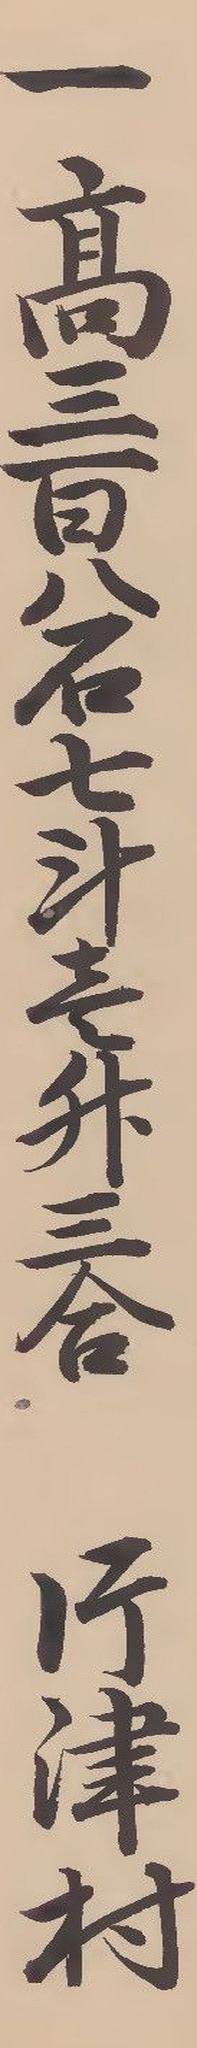一高三百八石七斗壱升三合片津村

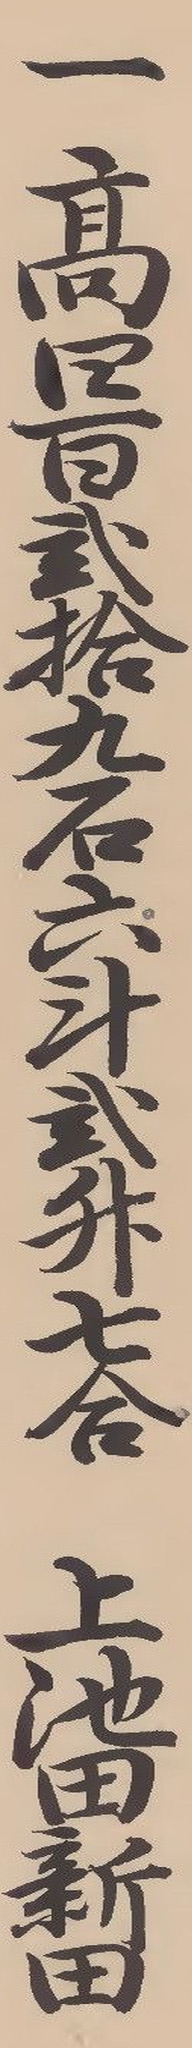一高四百弐拾九石六斗弐升七合上池田新田
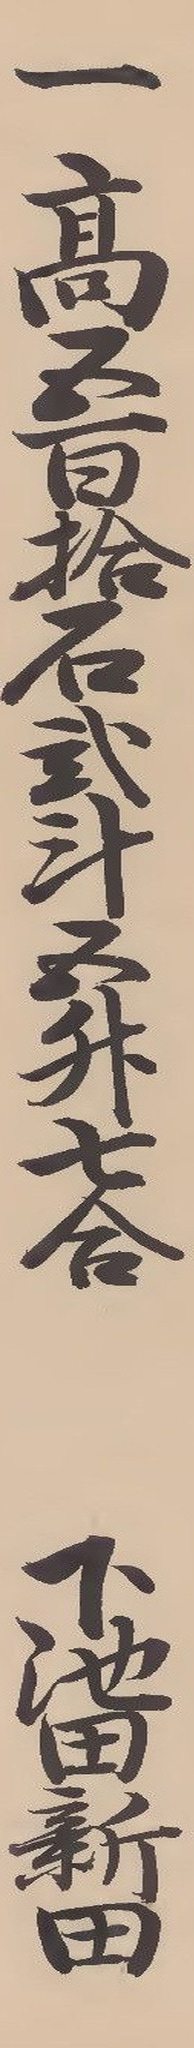一高五百拾石弐斗五升七合下池田新田
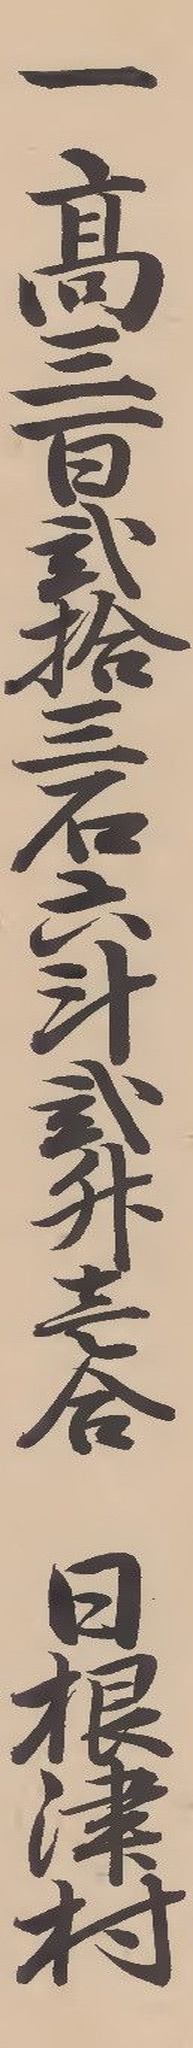一高三百弐拾三石六斗弐升壱合日根津村
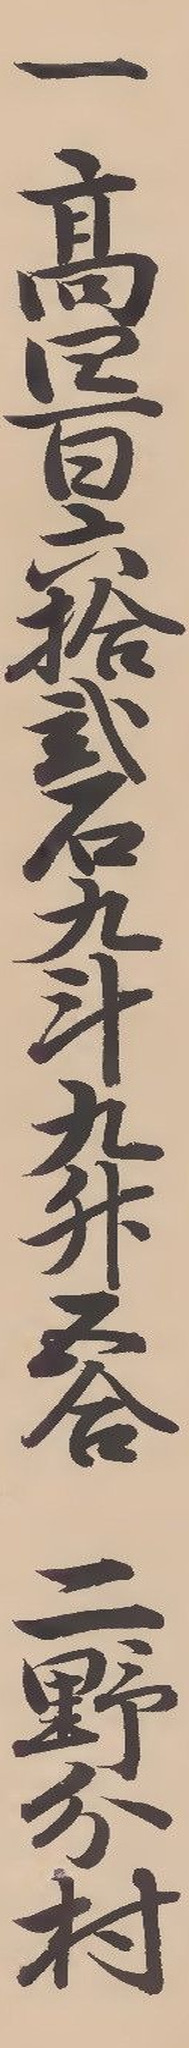一高四百六拾弐石九斗九升五合二野分村
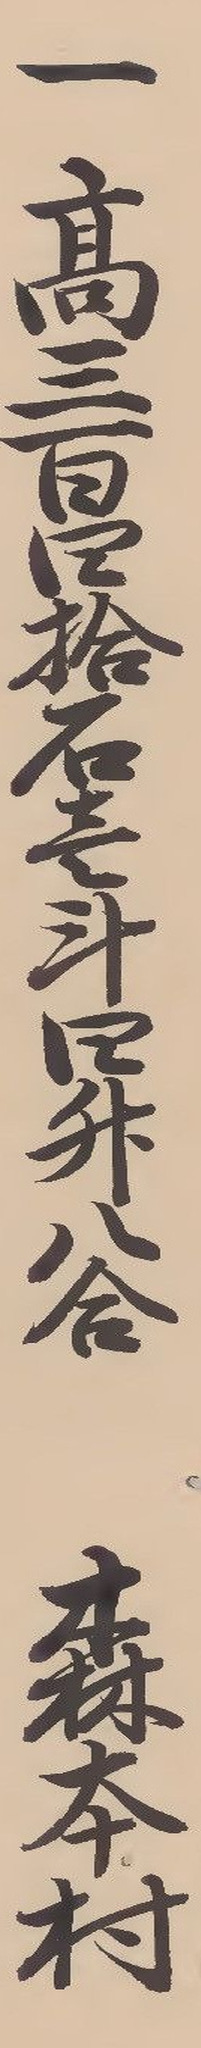一高三百四拾石壱斗四升八合森本村
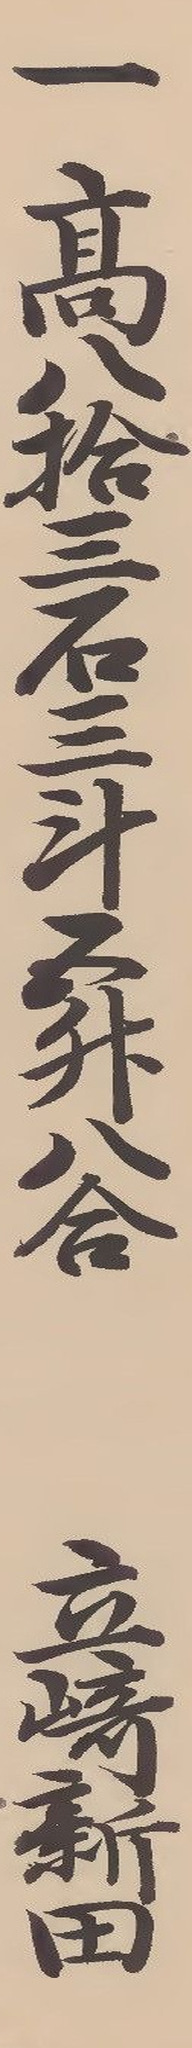一高八拾三石三斗五升八合立崎新田
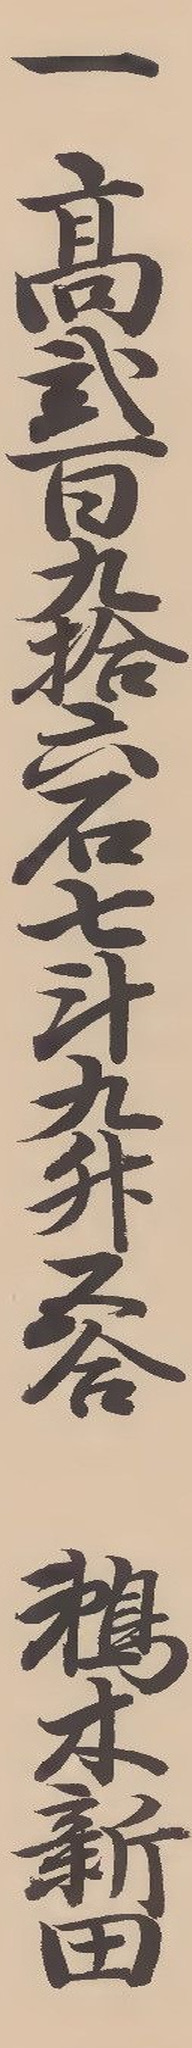一高弐百九拾六石七斗九升五合鵜木新田

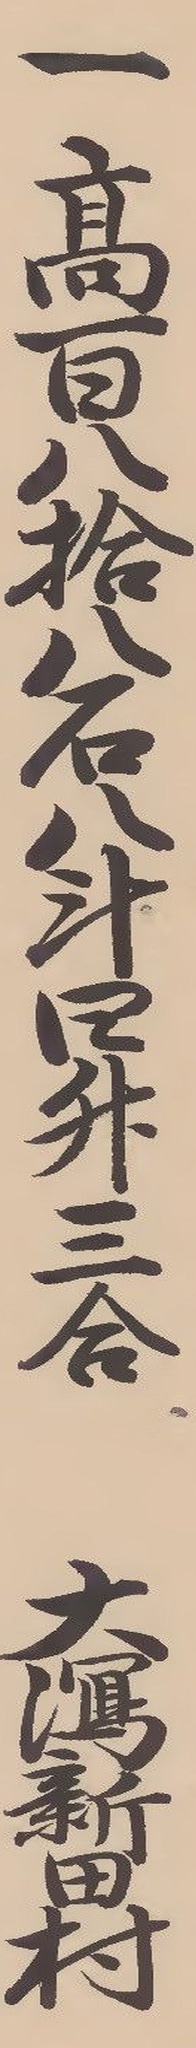一高百八拾八石八斗四升三合大潟新田村
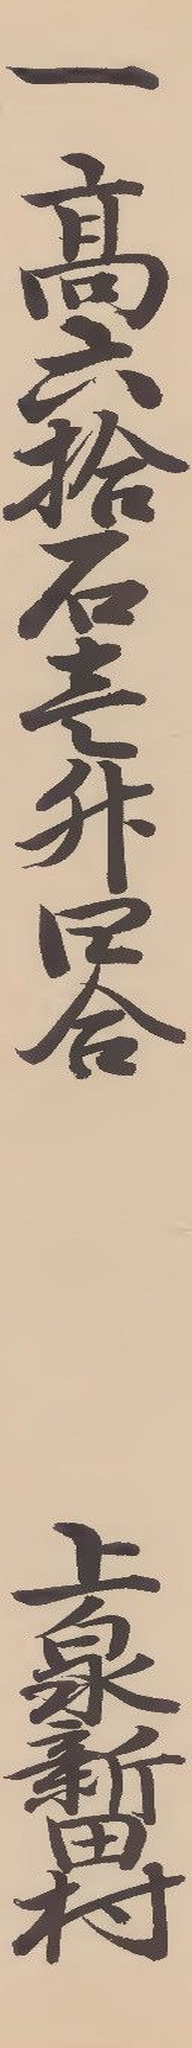一高六拾石壱升四合上泉新田村
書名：越後国郷帳　上
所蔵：国立公文書館 National Archives of Japan
